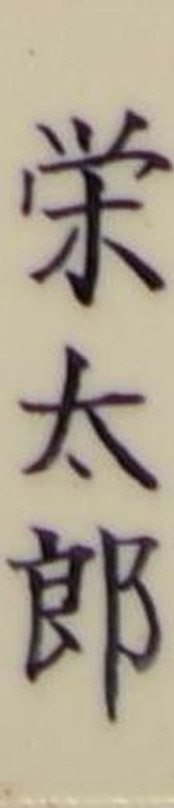栄太郎
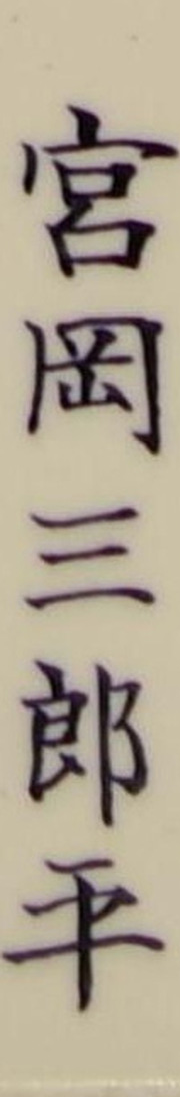宮岡三郎平
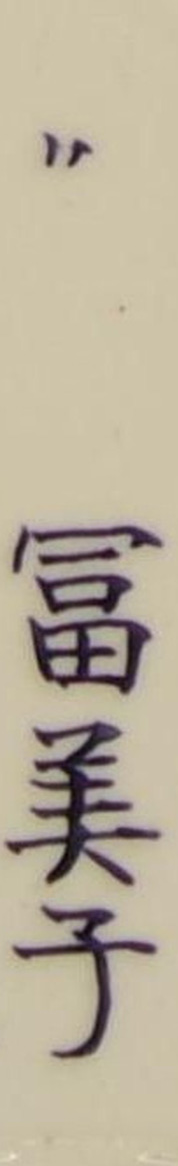冨美子
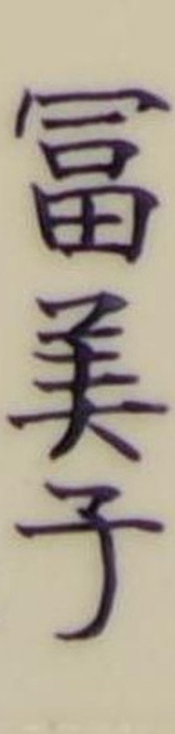冨美子
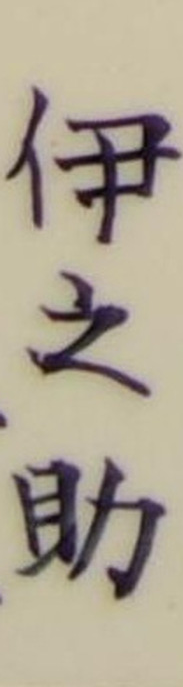伊之助

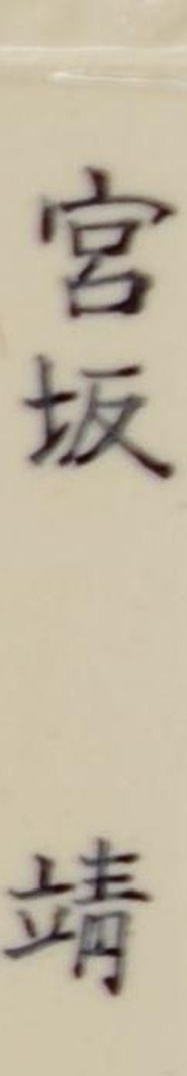宮坂靖
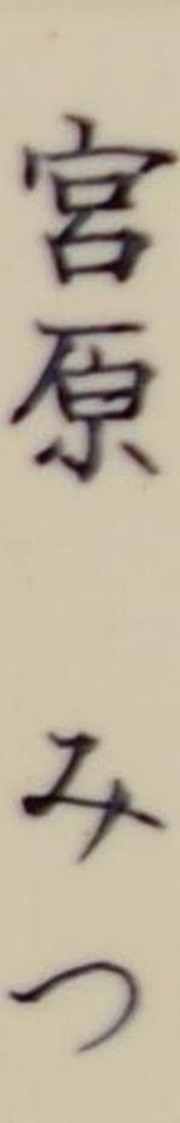宮原みつ
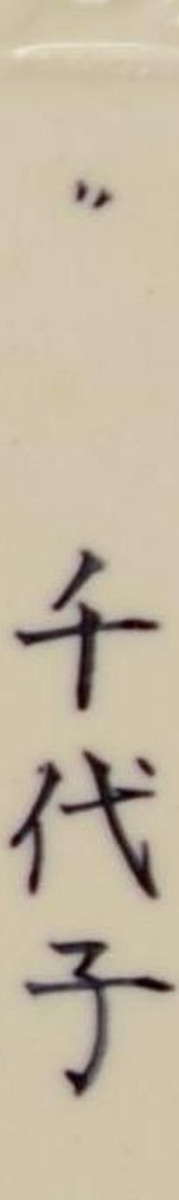千代子
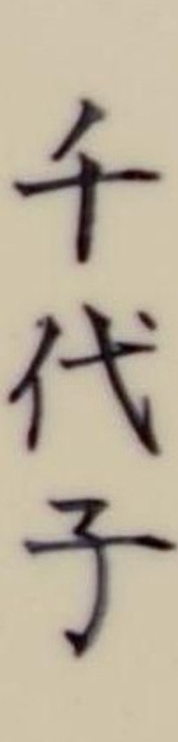千代子
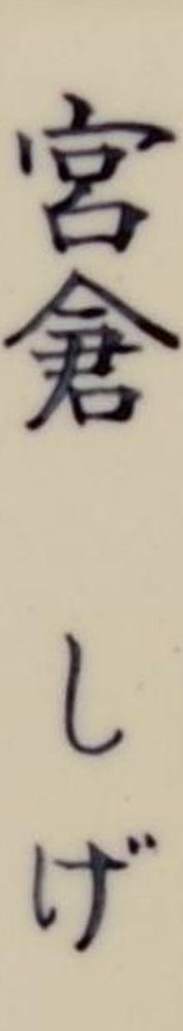宮倉しげ
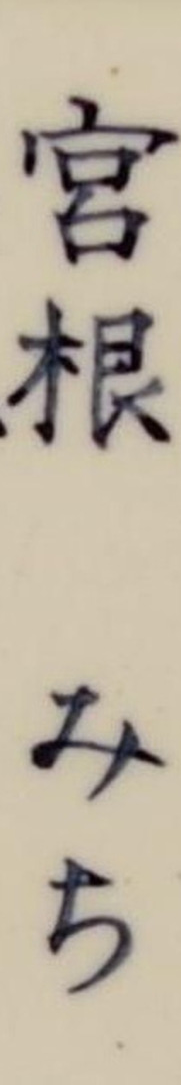宮根みち
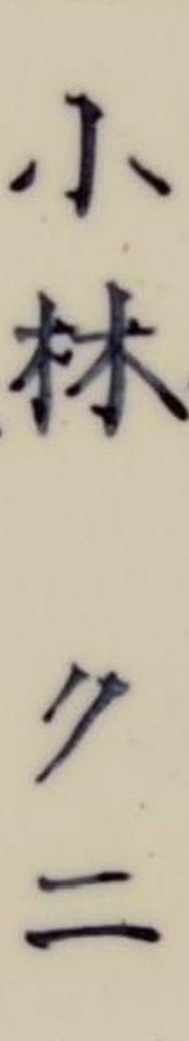小林ク二
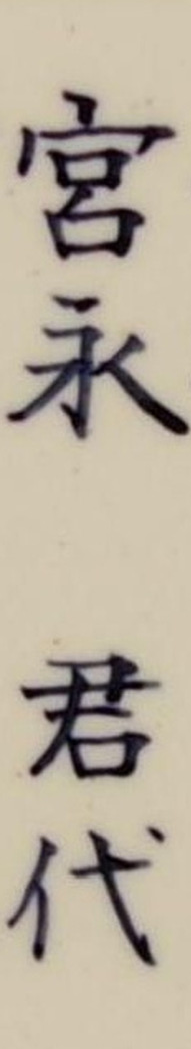宮永君代
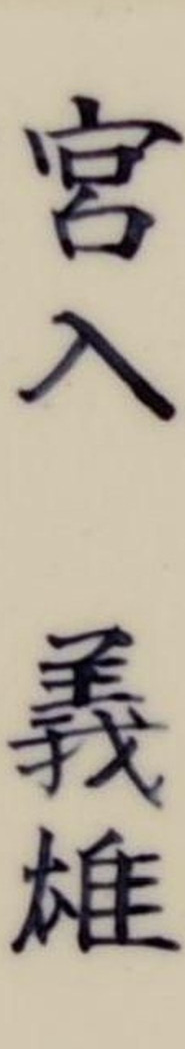宮入義雄
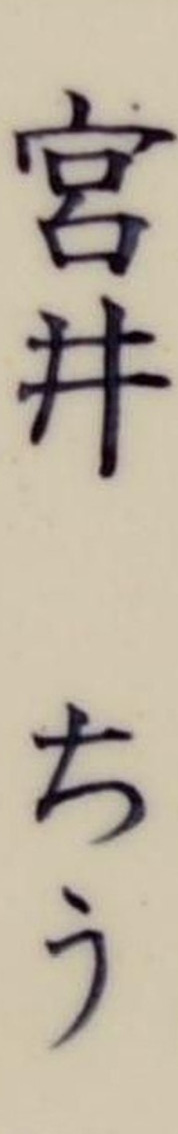宮井ちう
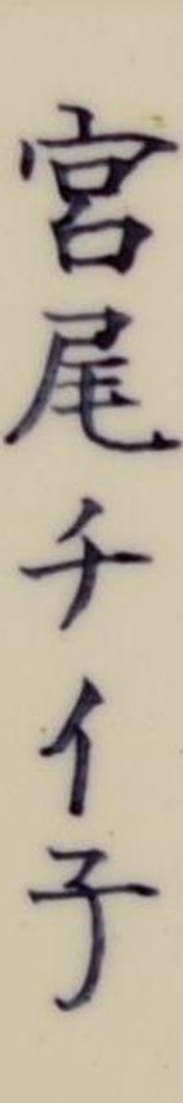宮尾チイ子
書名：E~L
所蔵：高野山金剛峯寺
